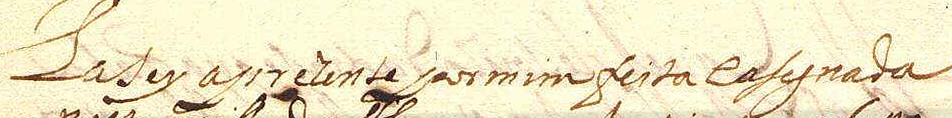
Pasey a prezente por mim feita e asignada
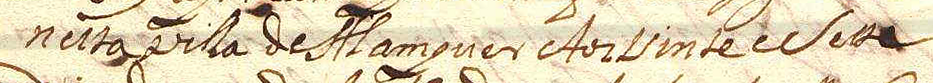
nesta villa de Alamquer Aos vinte e Sette
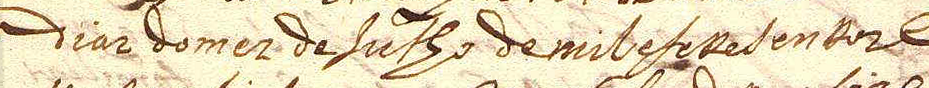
dias do mez de Julho de mil e settesenttos e
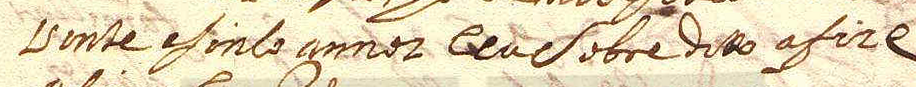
vinte e sinco annoz e eu Sobreditto a fiz e
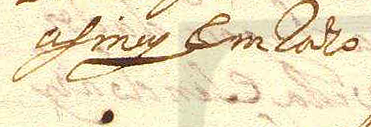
asiney Em Razo
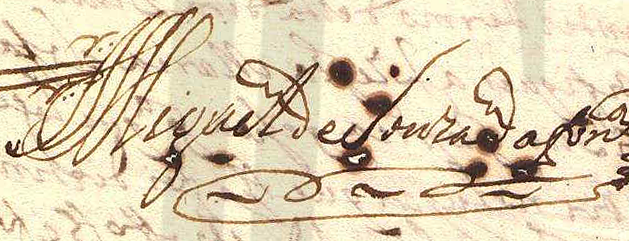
Miguel de Souza da fonca
